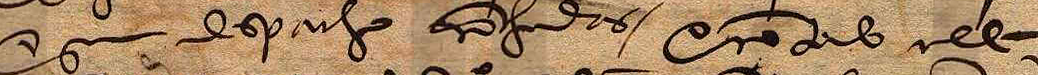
ē seu despacho cōtheudas / e c̄otodo elle
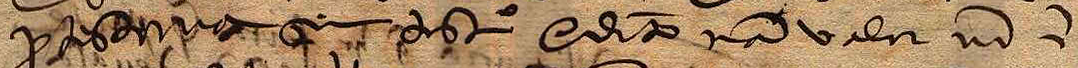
ꝓtestaua seu testo e dito nā valer nē ē
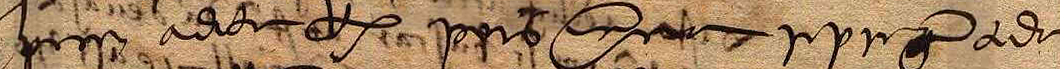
pecer a dita Rꝭ pois nā era repregūtada
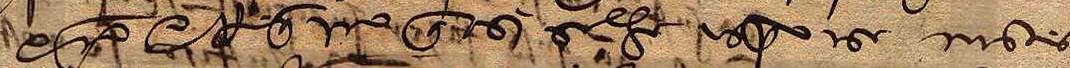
e c̄ꝭ e Req̄reo q̄ asj se lhe esp̄vese nestes
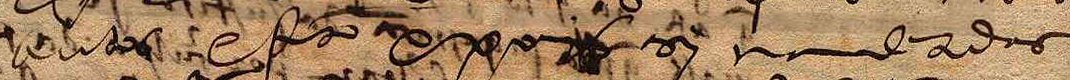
autos e fctō e poys asy era de todas
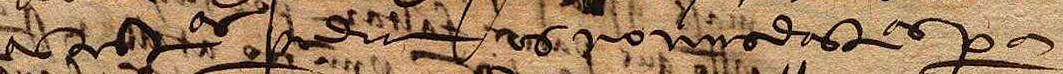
as testas pedia os nomes das tas ꝑa
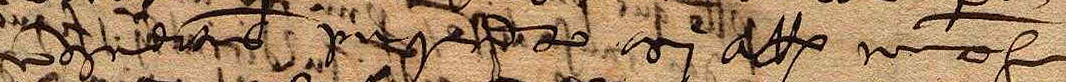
c̄otraditas porquāto asy a Rꝭ como ha
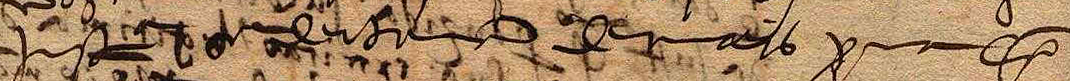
Justa se deitauā de mais ꝓua e c̄ꝭ
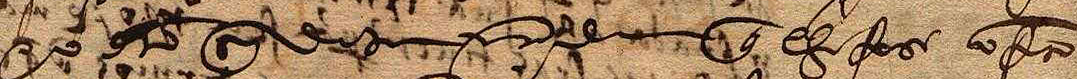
e o dtō sōr doutor mādou q̄ lhe fose o fct̄o
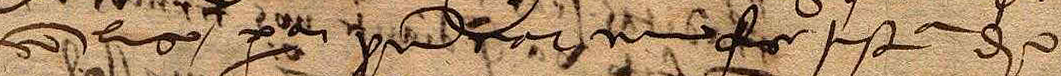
cōcluso / ꝑa ꝓnūciar como fose Justa djo
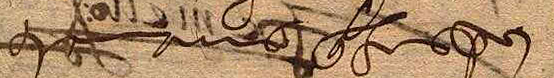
trauaços q̄ ho esp̄vj
